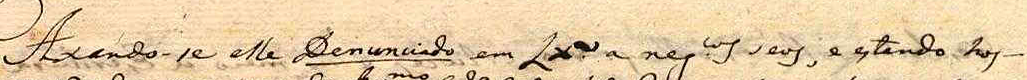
Axando-se elle Denunciado em Lx.a a nes.tos seos, e estando hos
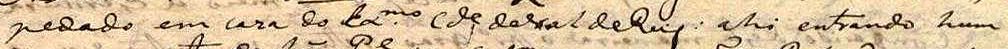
pedado em caza do Ex.mo C.de do Val de Reis: ahi entrando hum
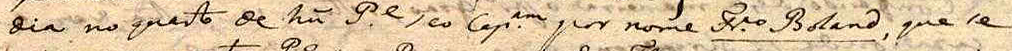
dia no quarto de hū P.e seo Cap.am por nome Fr.co Boland, que se
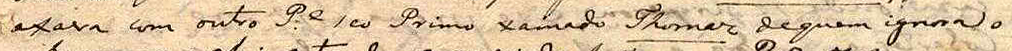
axava com outro P.e seo Primo xamado Thomaz de quem ignora o
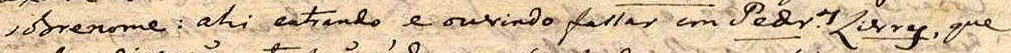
sobrenome: ahi entrando e ouvindo fallar em Pedr.os Livres, que
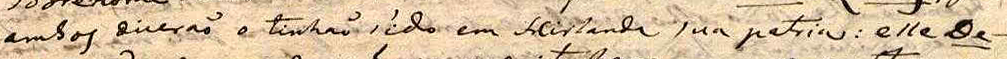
ambos diceraõ o tinhaõ sido em Hirlanda sua patria: elle De
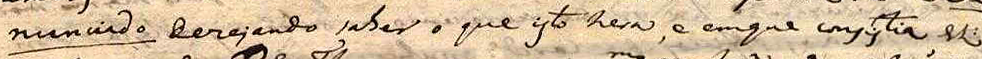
nunciado dezejando saber o que isto hera, e em que consistia &c.
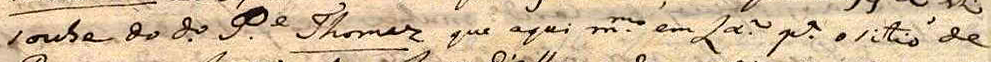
soube do d.o P.e Thomaz que aqui m.mo em Lx.a p.a o sitio de
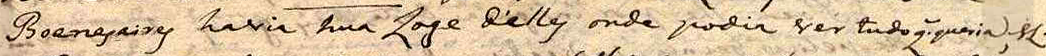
Boenosaires havia huā Loge d'elles onde podia ver tudo q̄ queria, &c.
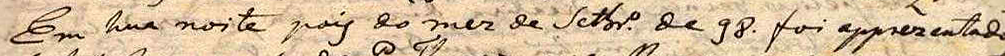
Em hua noite pois do mez de Setbr.o de 98. foi apprezentado
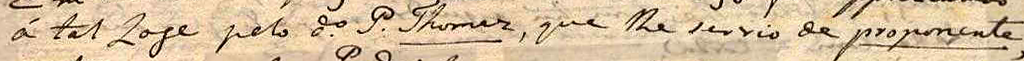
á tal Loge pelo d.o P.e Thomaz, que lhe servio de proponente,
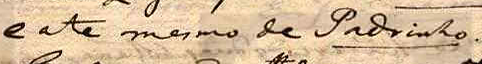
e ate mesmo de Padrinho.
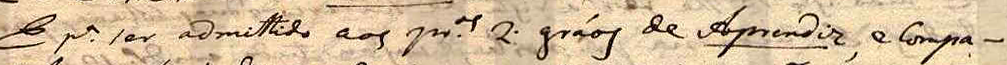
E p.a ser admittido aos pr.os 2. gráos de Aprendiz, e Compa
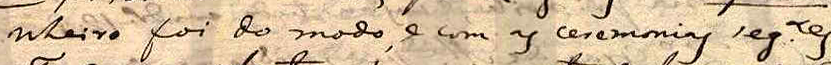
nheiro foi do modo, e com as ceremonias seg.tes
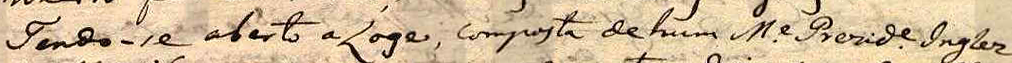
Tendo-se aberto a Loge composta de hum M.e Prezid.e Inglez
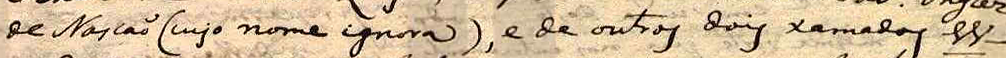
de Nascaõ (cujo nome ignora), e de outros dois xamados &c.
